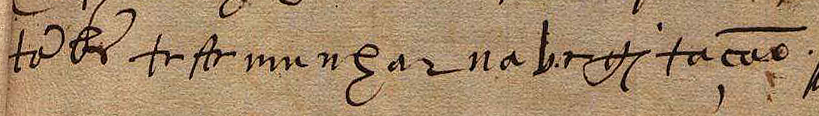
tābē testemunhar na vegjtação.
